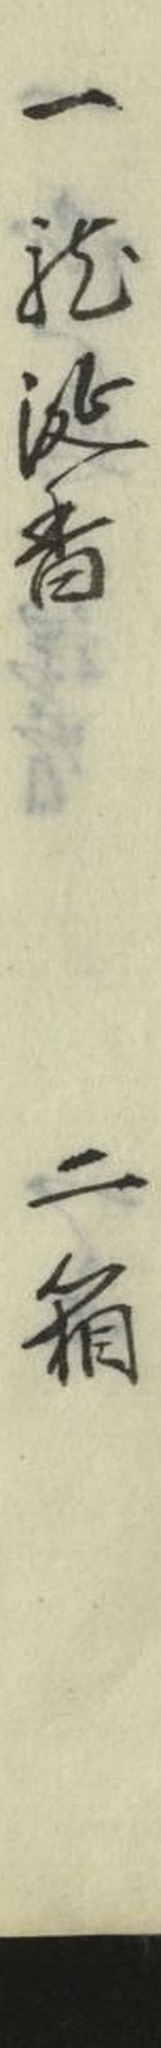一龍涎香二箱
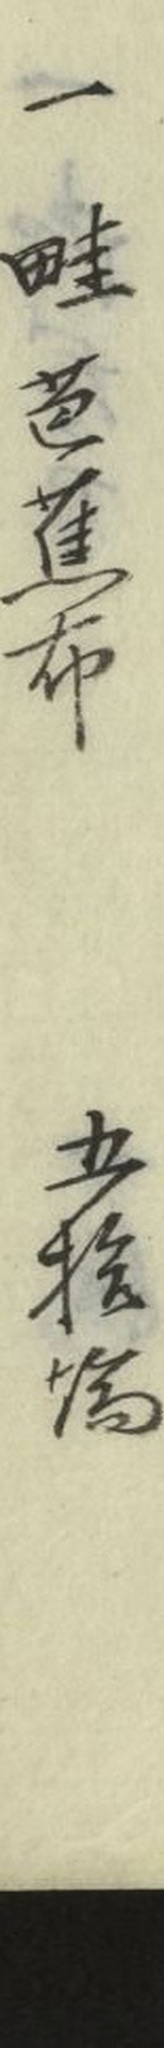一畦芭蕉布五拾端
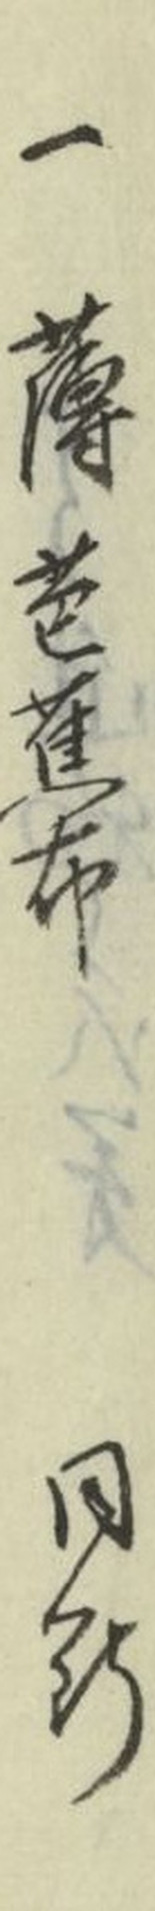一薄芭蕉布同断
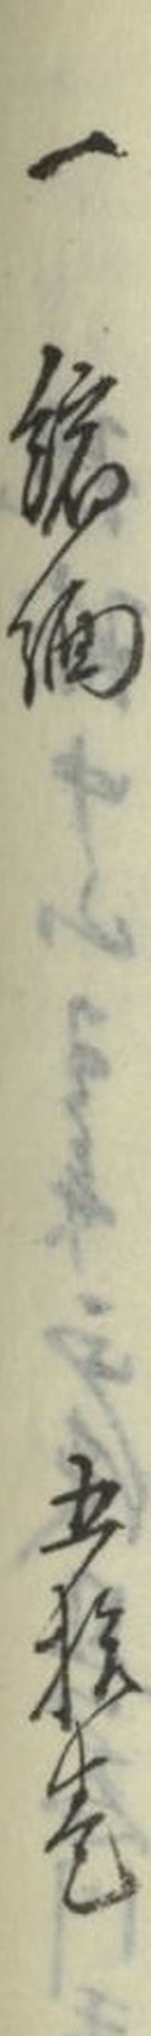一縮緬五拾巻
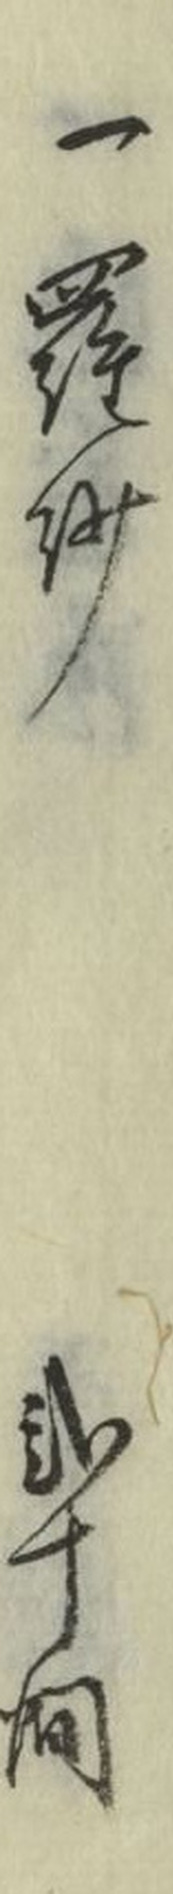一羅沙弐十間

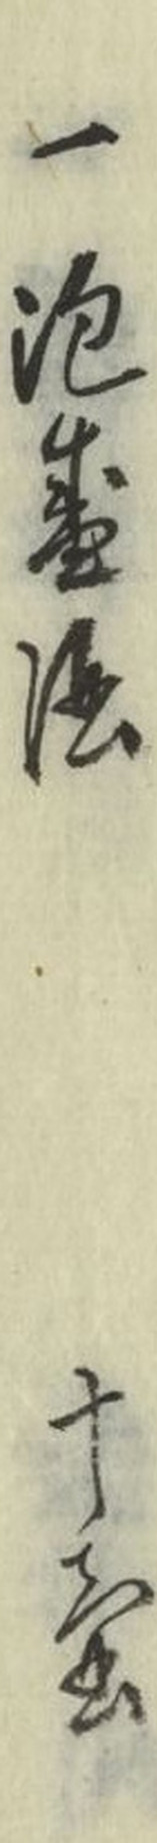一泡盛酒十壺
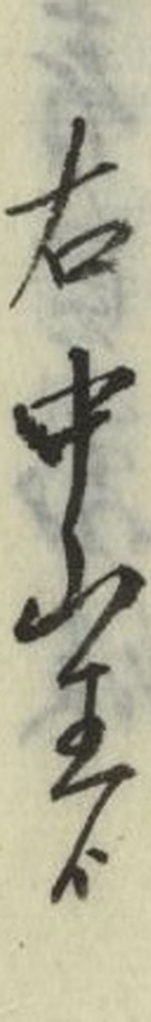右中山王ゟ
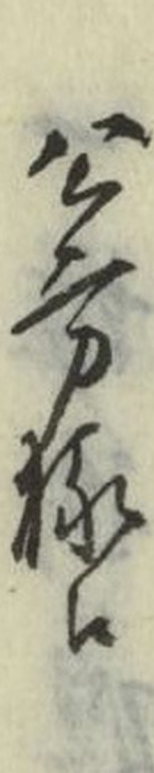公方様え
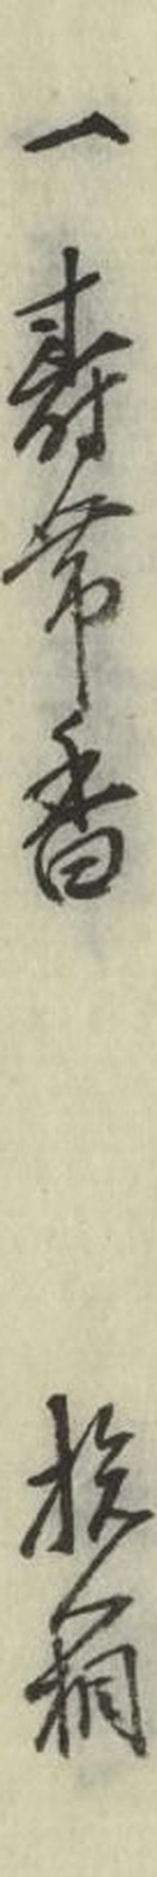一寿帯香拾箱
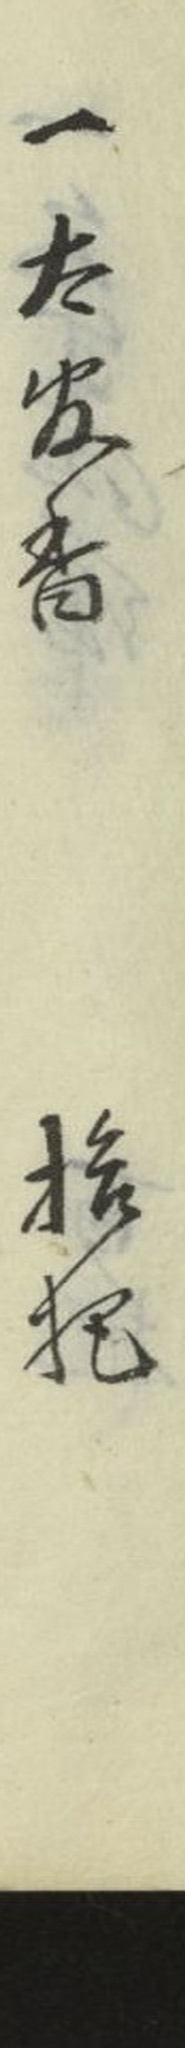一太官香拾把
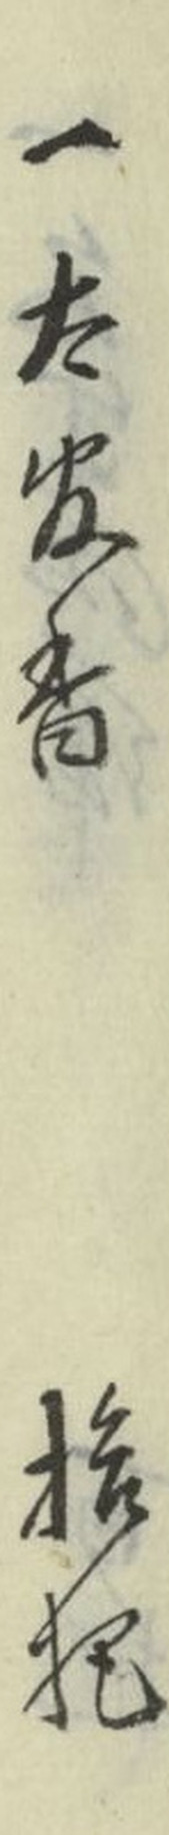一太官香拾把
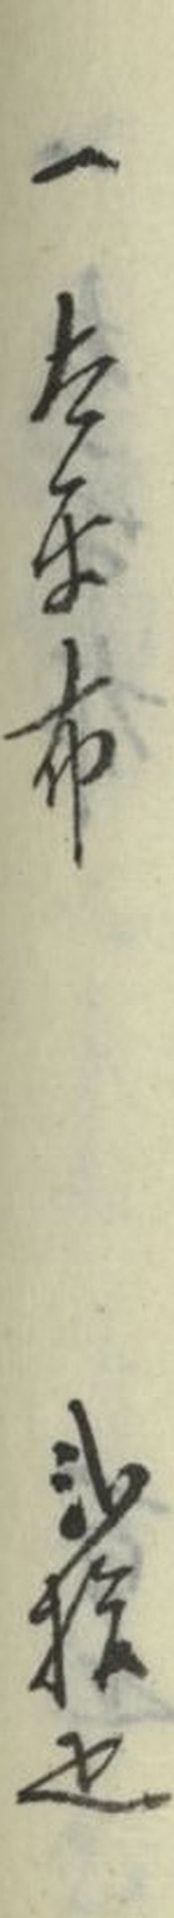一太平布弐拾疋
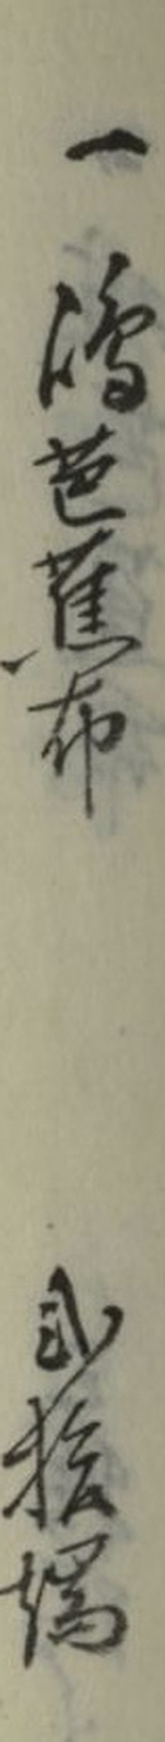一島芭蕉布弐拾端
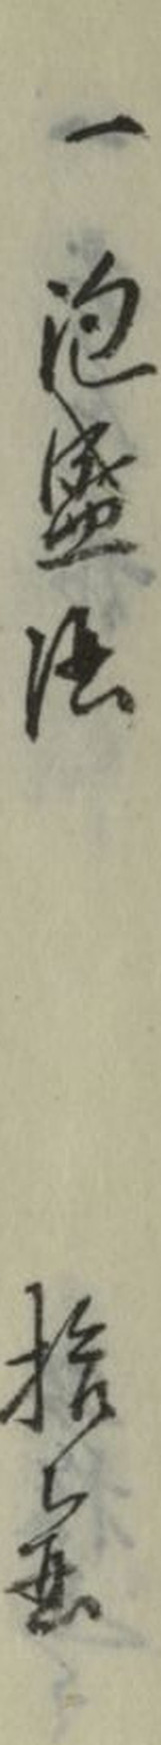一泡盛酒拾壺
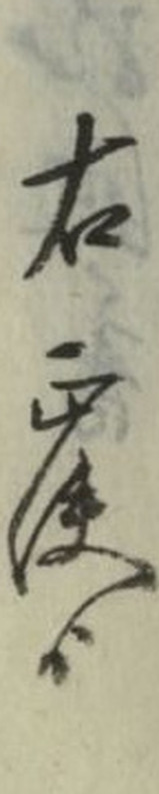右正使ゟ
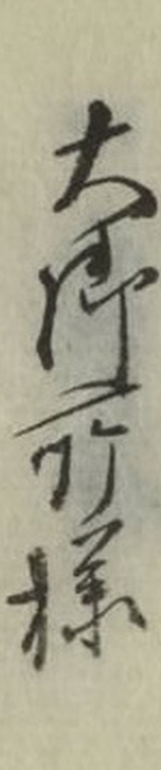大御所様
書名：琉球人来朝記 三
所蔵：University of the Ryukyus Library
